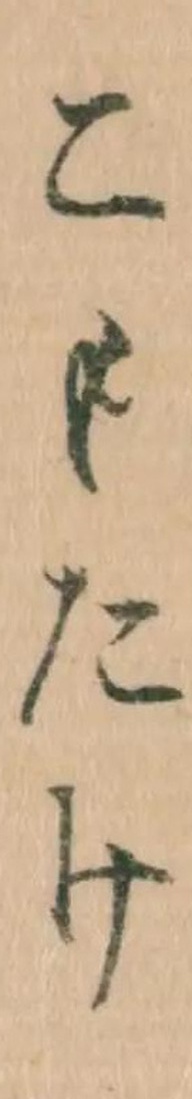こもたけ

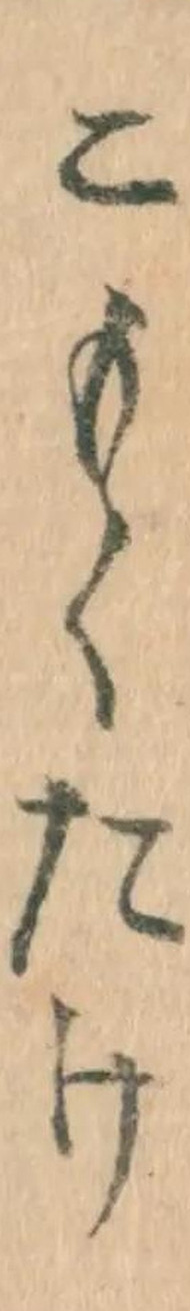こもくたけ
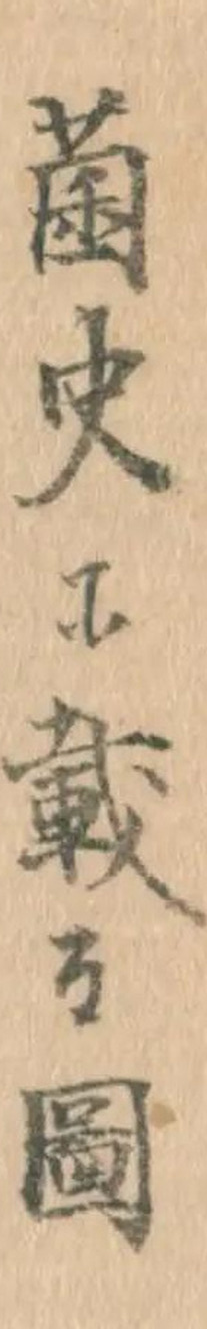菌史に載る図
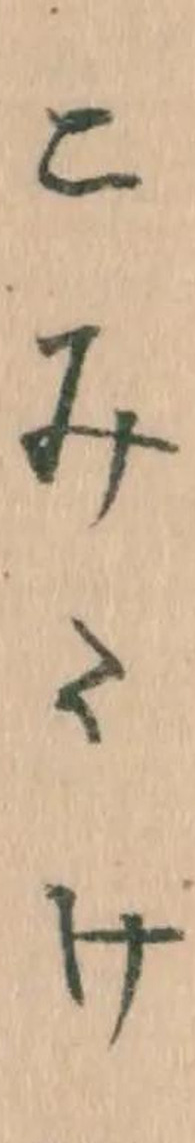こみたけ

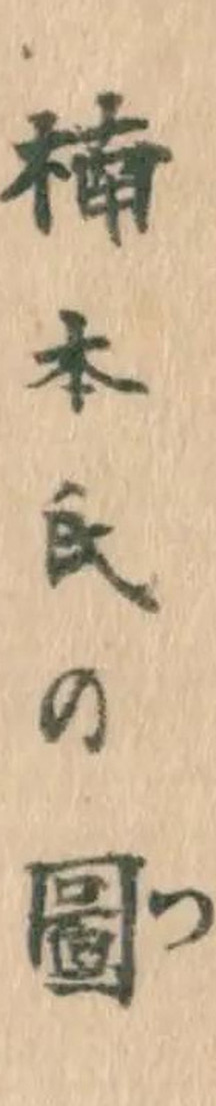楠本氏の図
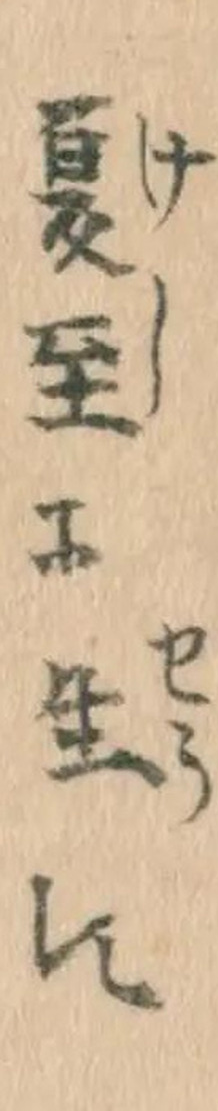夏至に生す
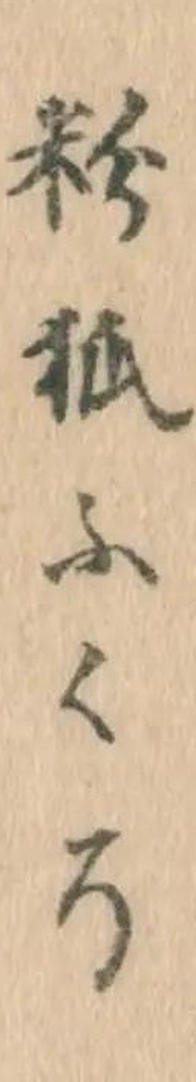粉狐ふくろ
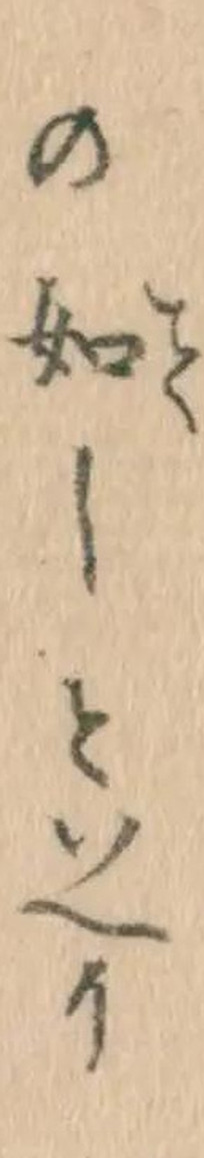の如しといへり
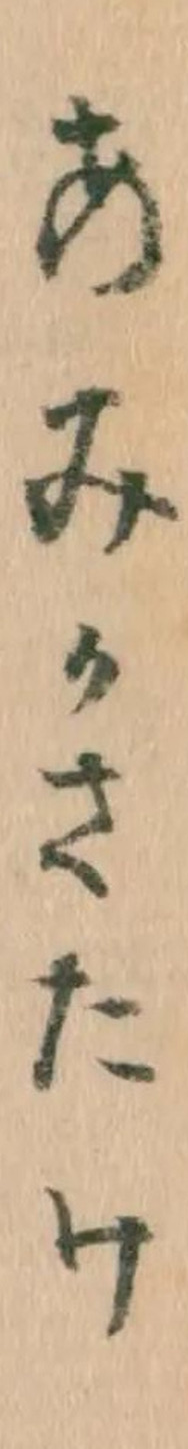あみかさたけ
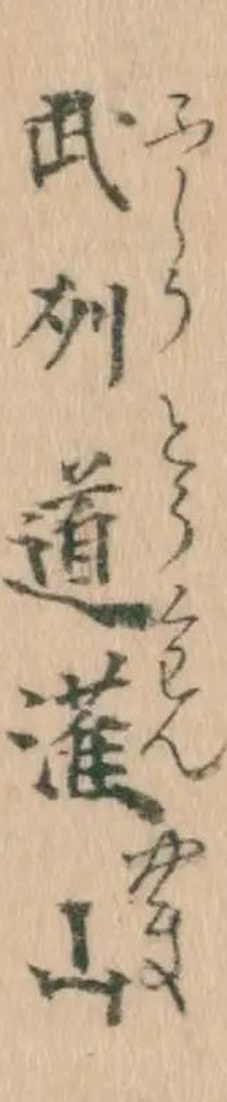武州道灌山
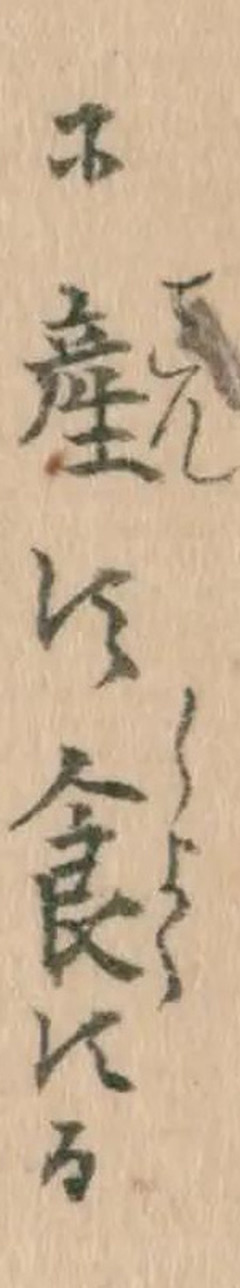に産す食する
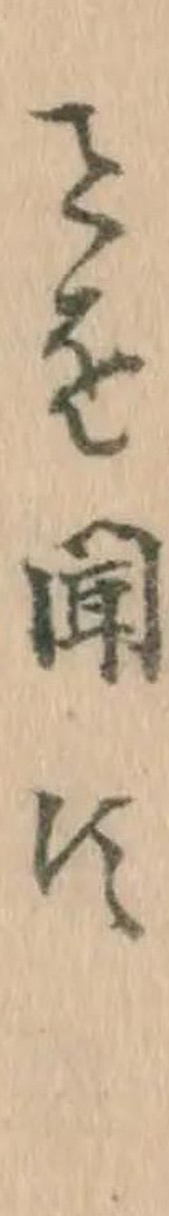ことを聞す

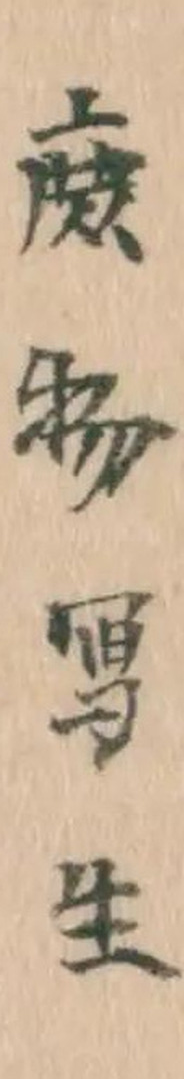庶物写生
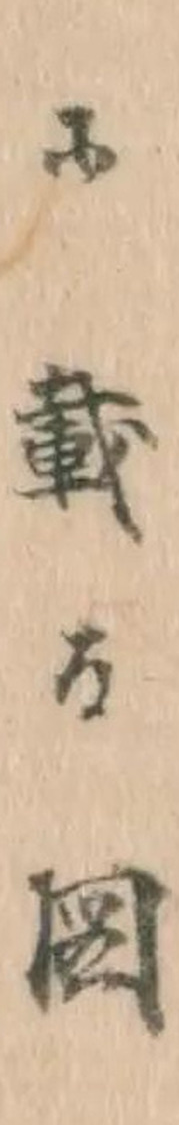に載る図

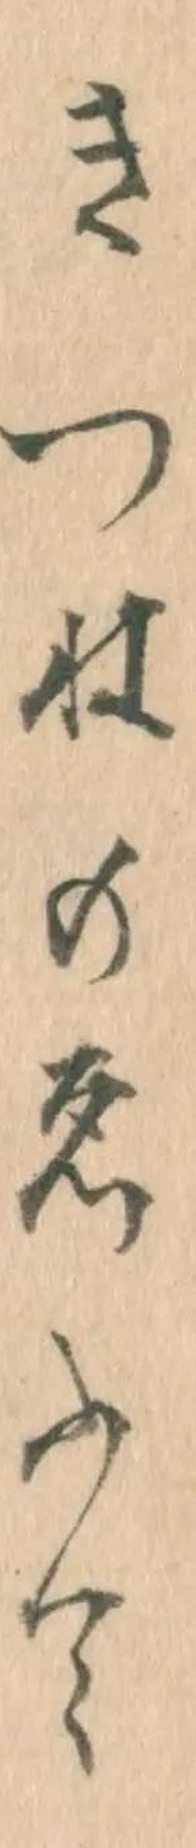きつねのゑふて
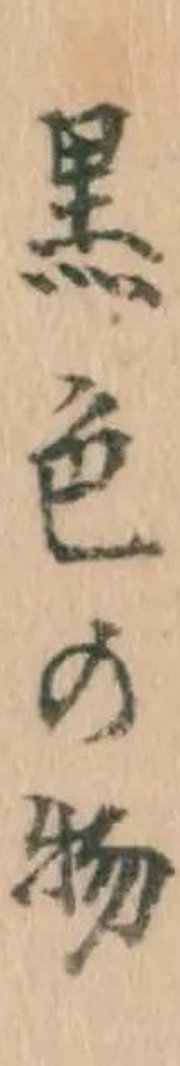黒色の物
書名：本草図譜. 巻58-60
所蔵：国立国会図書館 National Diet Library, JAPAN
